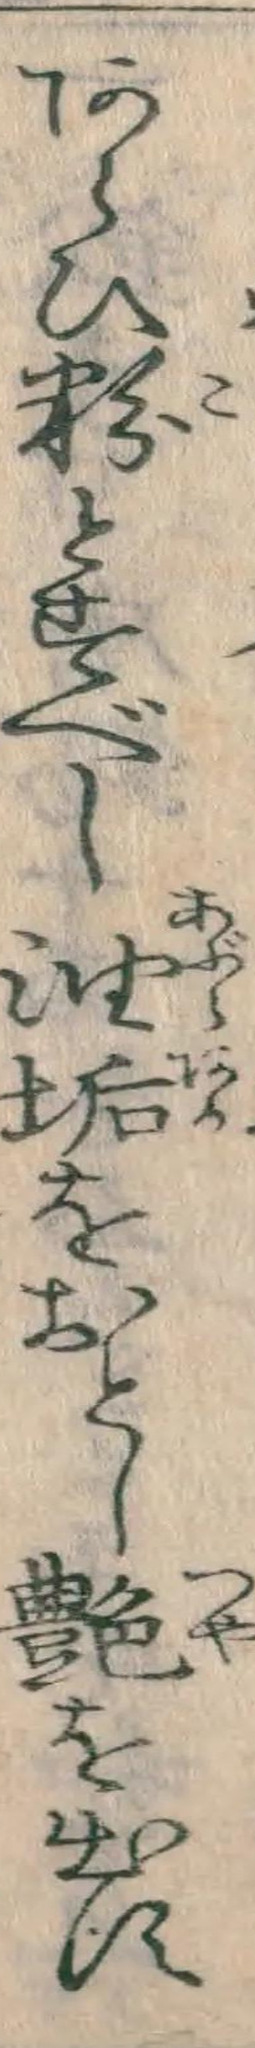あらひ粉とすべし油垢をおとし艶を出す
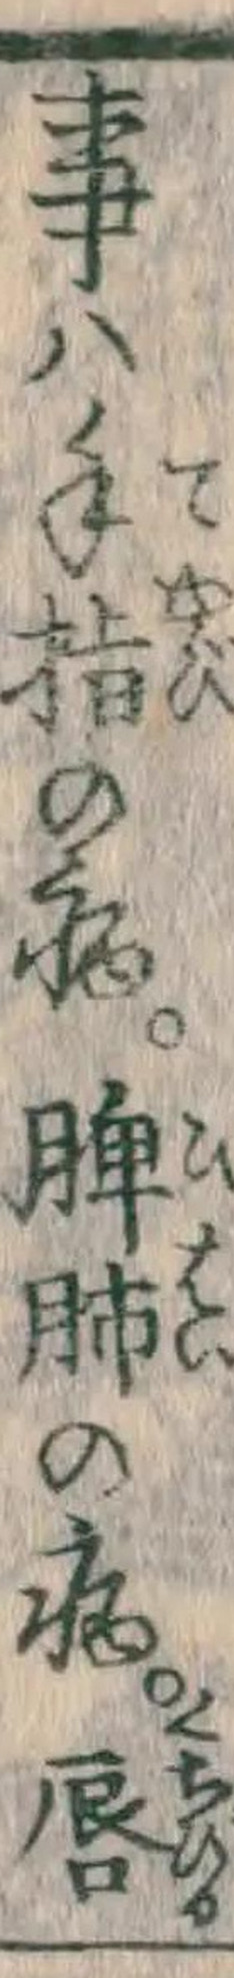事は手指の病。脾肺の病。唇
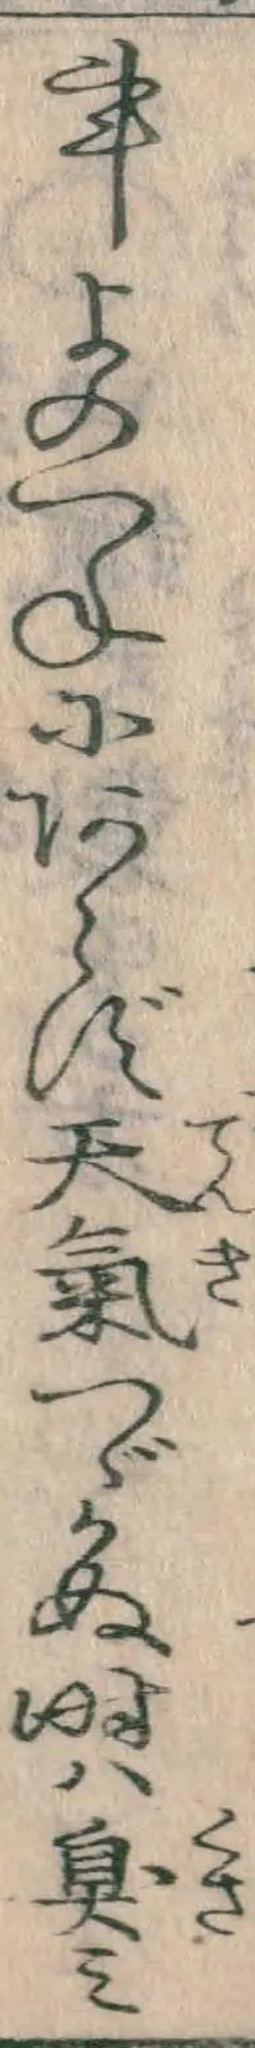事よのつねにあらず天気つゞかぬ時は臭み
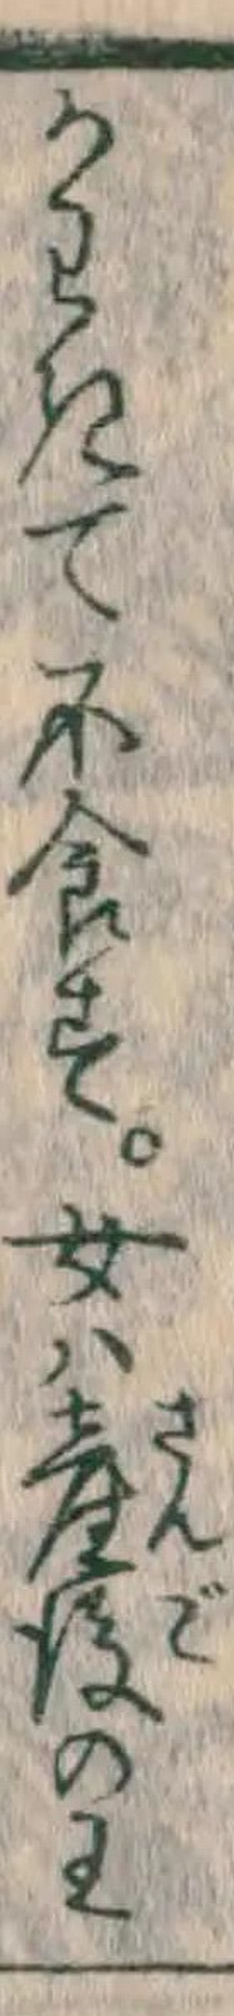かわきて不食す。女は産後のわ
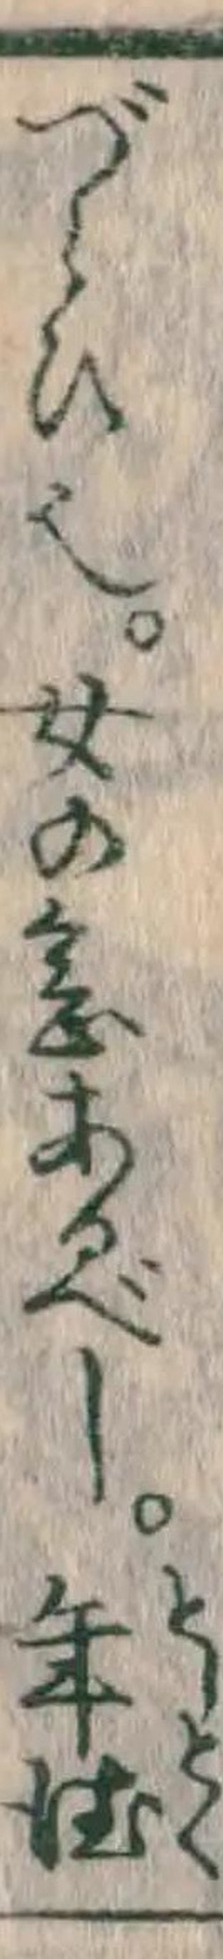づらひ也。女の念あるべし。年徳
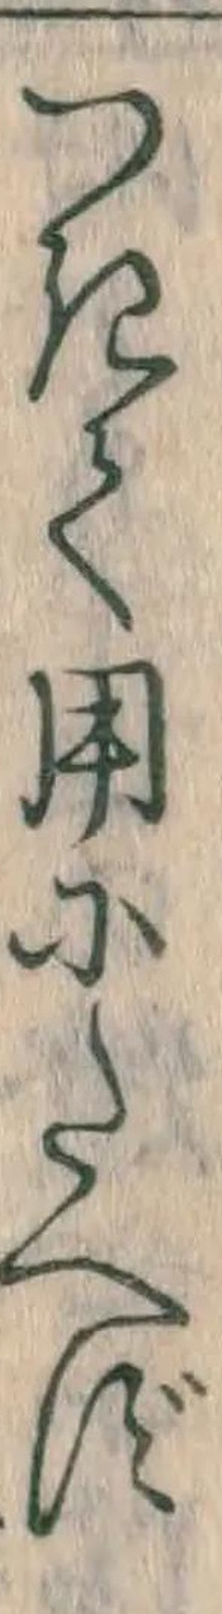つきて用にたへず
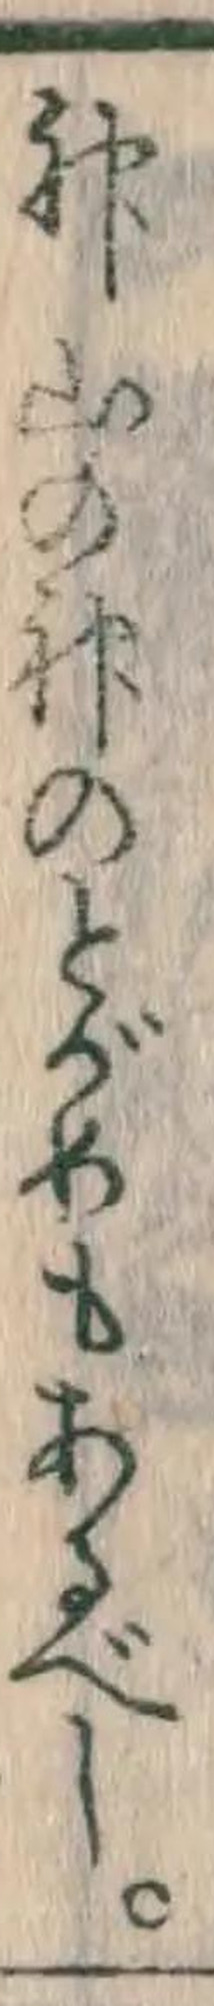神山の神のとがめもあるべし。
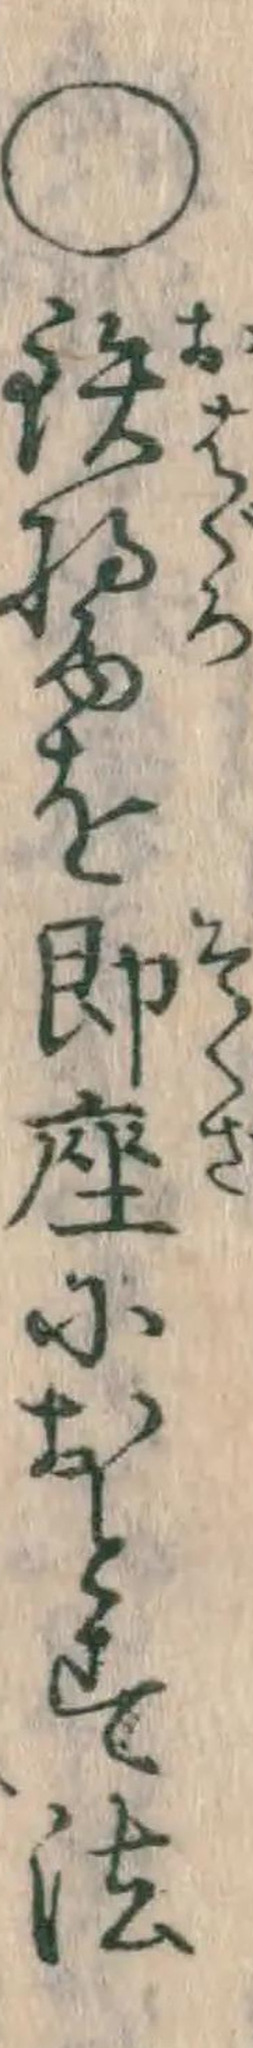○鉄醤を即座におとす法
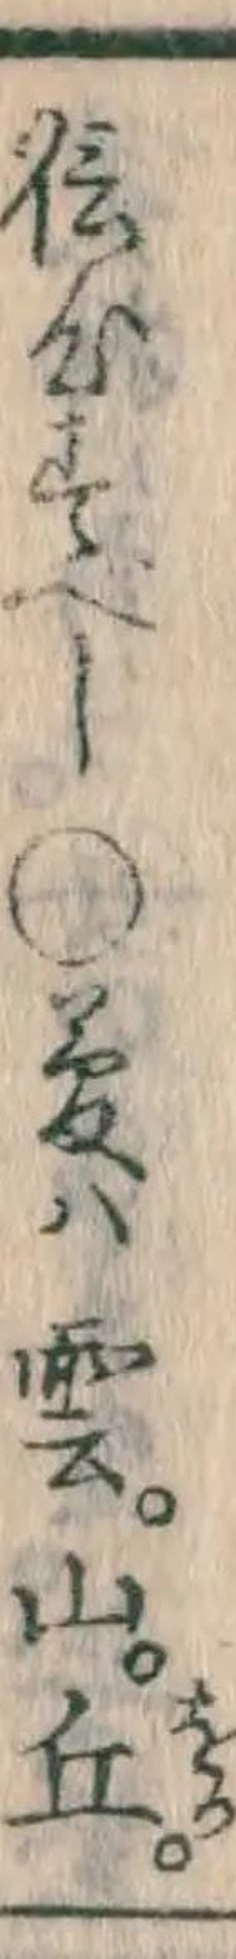信心すべし○夢は雲。山。丘。
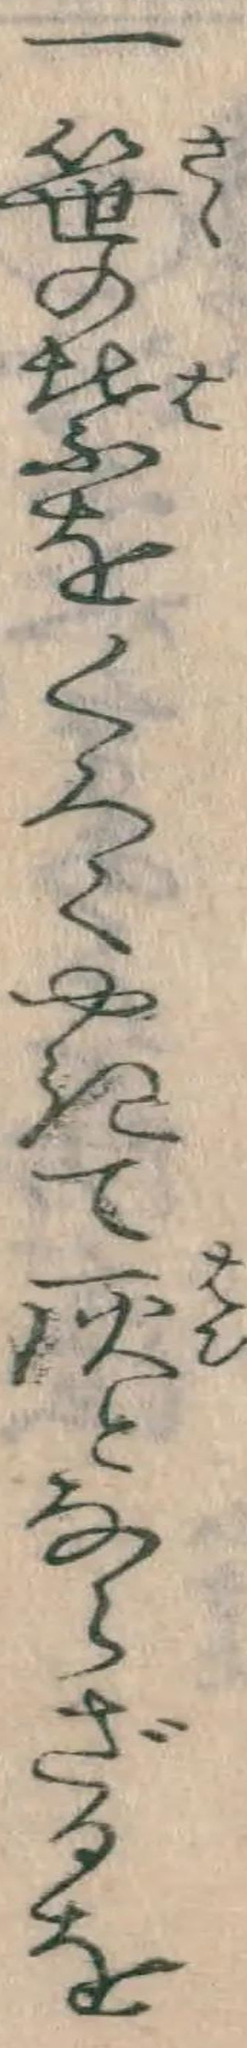一笹の葉をくろくやきて灰とならざるを
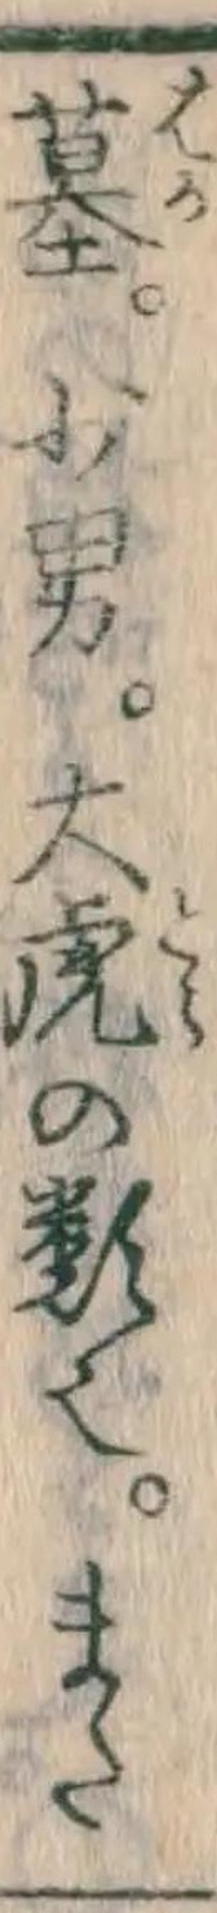墓。少男。大虎の類也。また
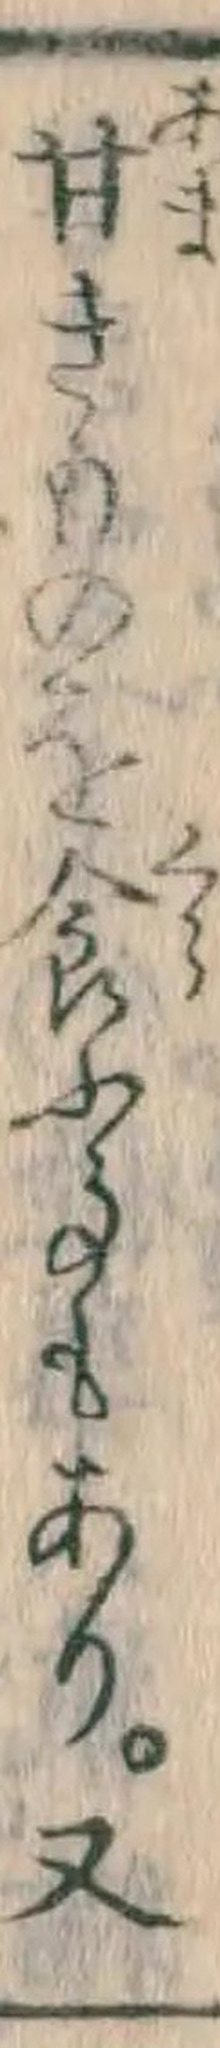甘きものを食ふ事もあり。又
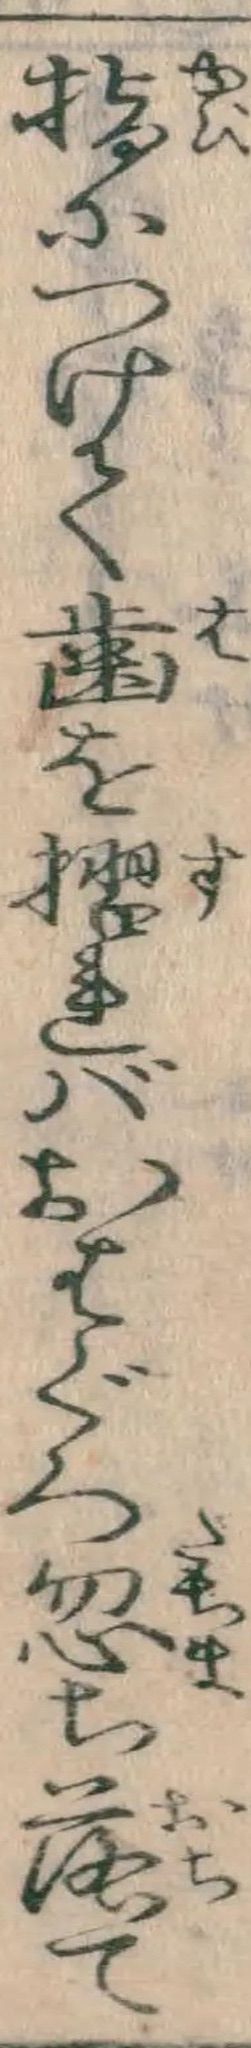指につけて歯を摺ればおはぐろ忽ち落て
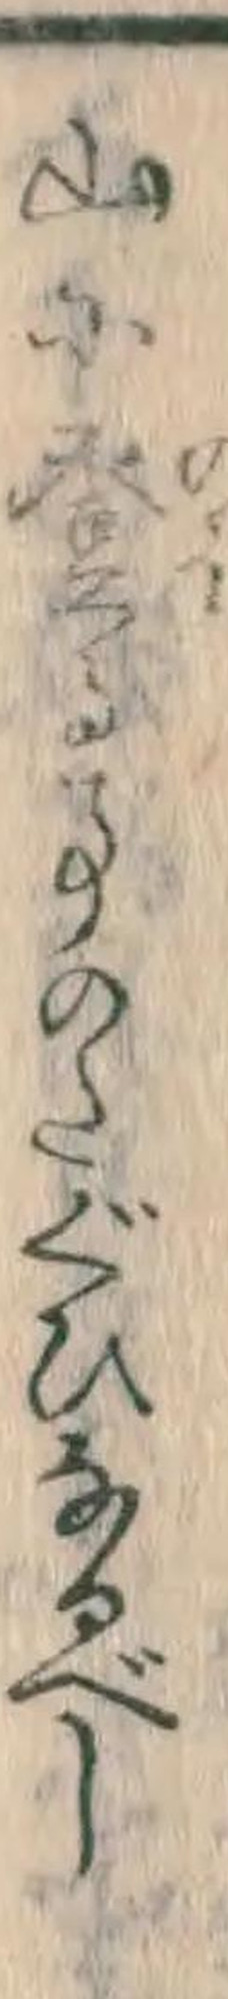山に登る事のたぐひなるべし
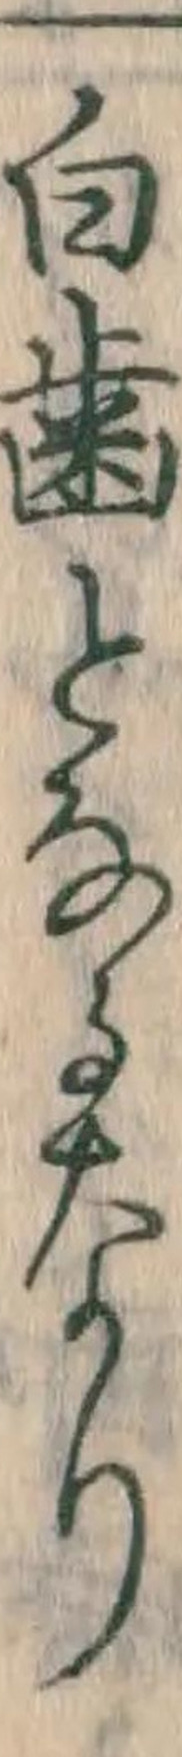白歯となるなり
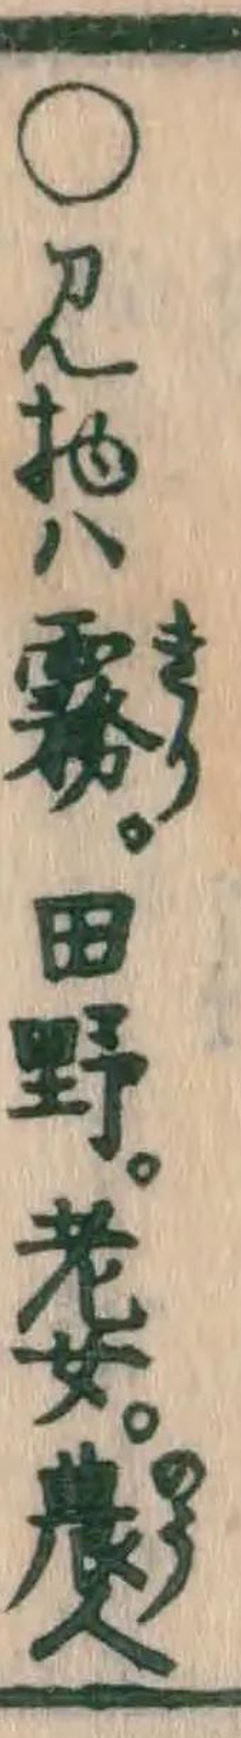○見物は霧。田野。老女。農人
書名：広益秘事大全 3巻. [1]
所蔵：国立国会図書館 National Diet Library, JAPAN
